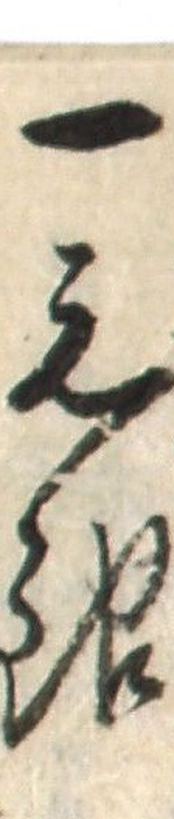一元銀
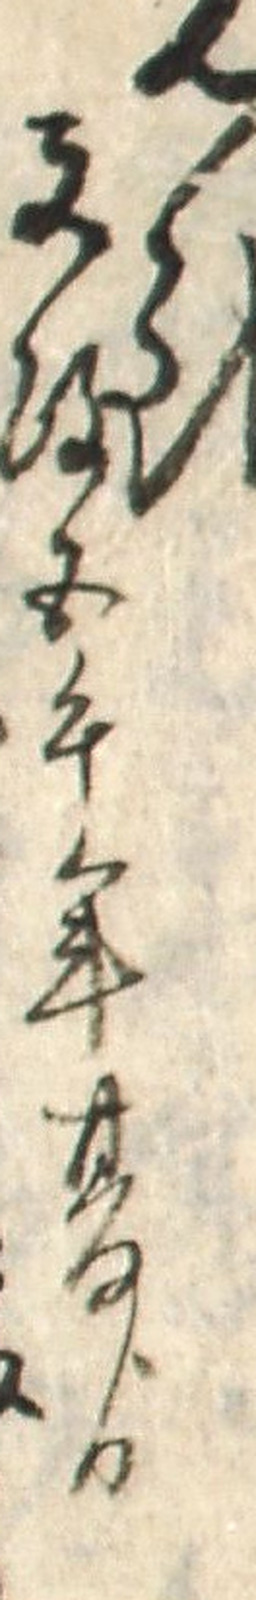文政五午年夏ゟ

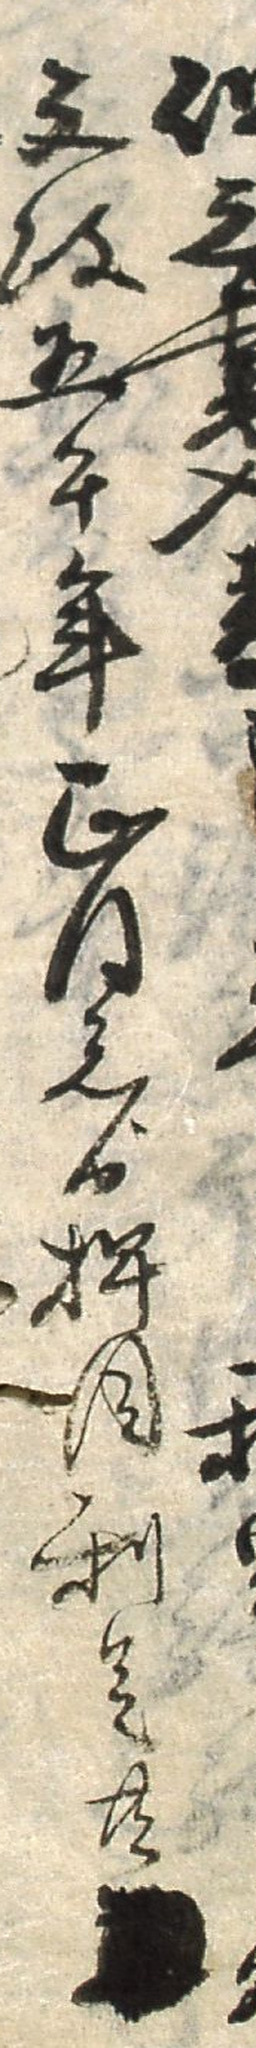文政五午年正月元ゟ押目利足共
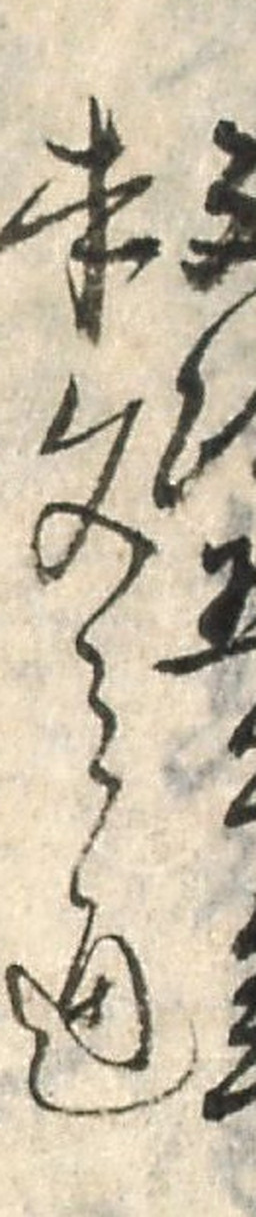本文之通
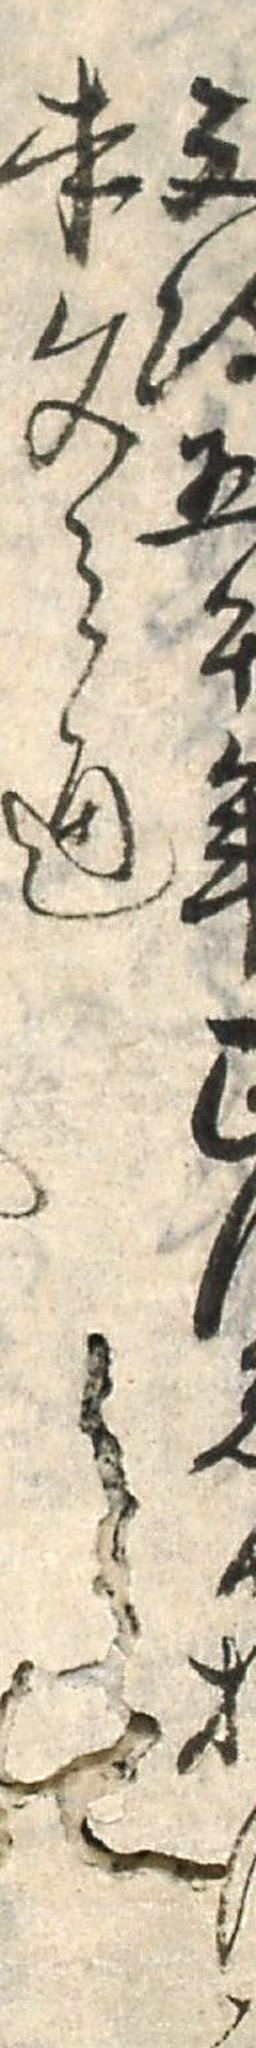本文之通
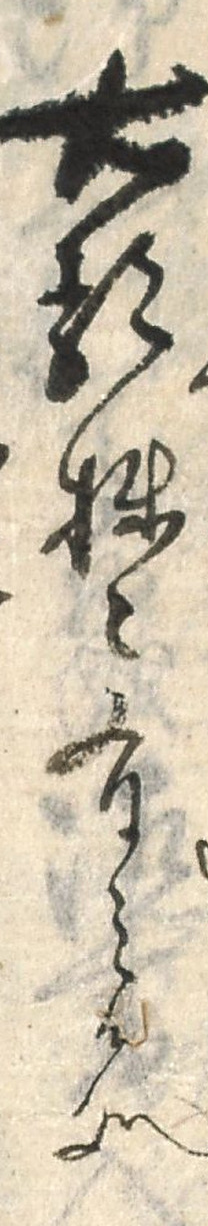右類株々有之候処
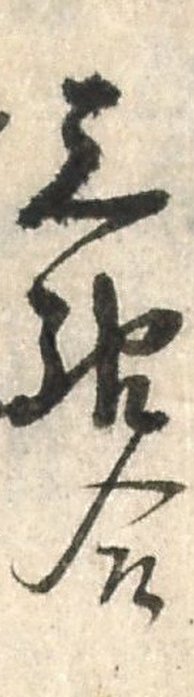元銀合
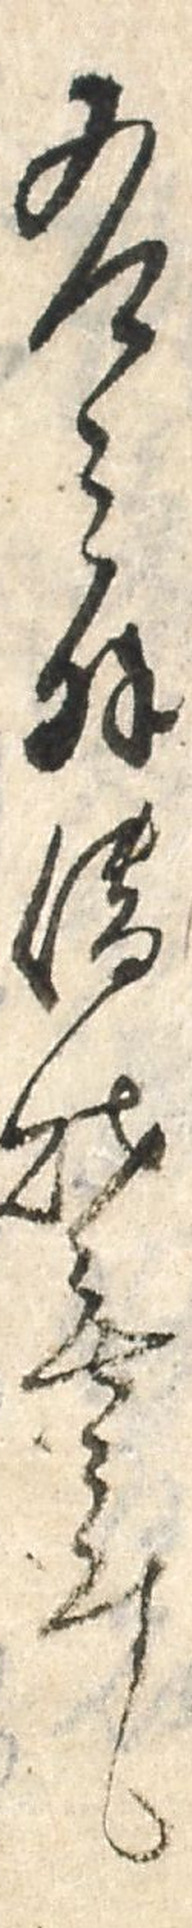右之外借財無御座候
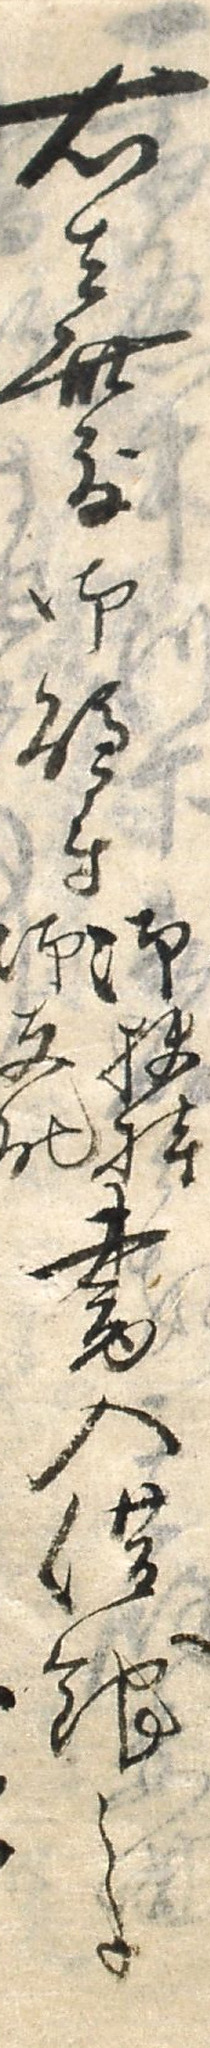右は此度御尋に付御扶持御支配書入借銀之事
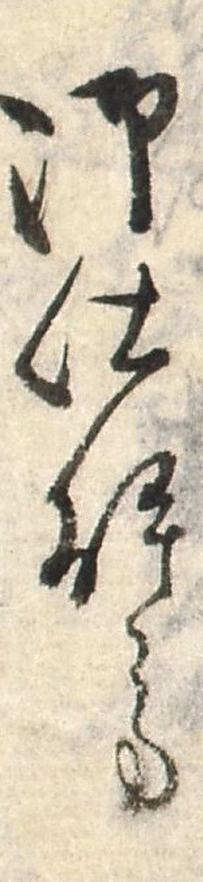御仕解方

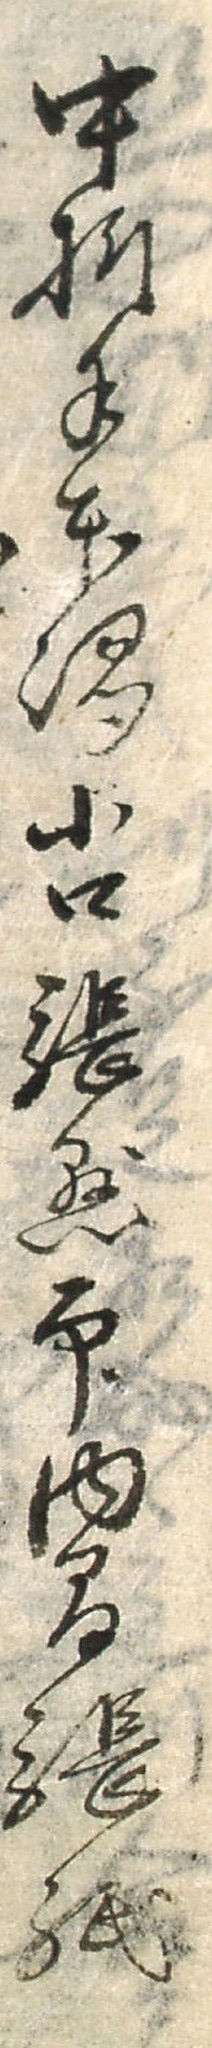中折手本認め小口張懸印内間張紙
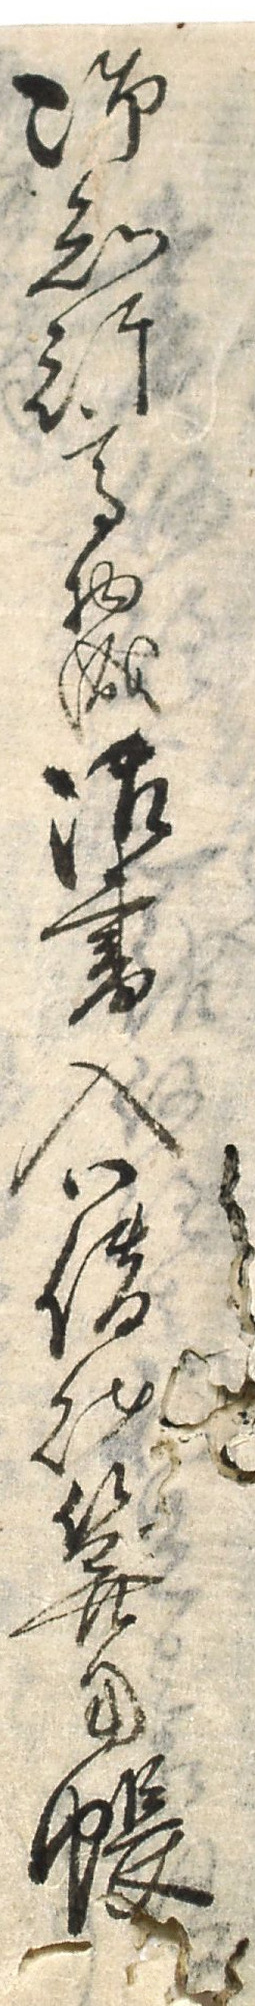御知行高物成御書入御借財算用帳
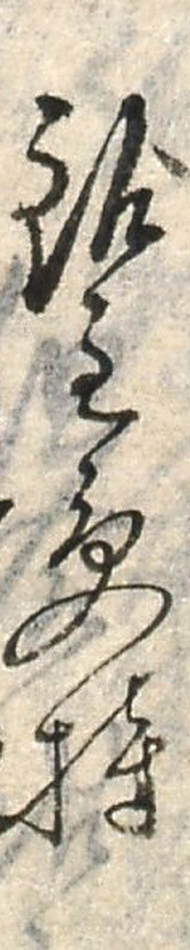銀主受持
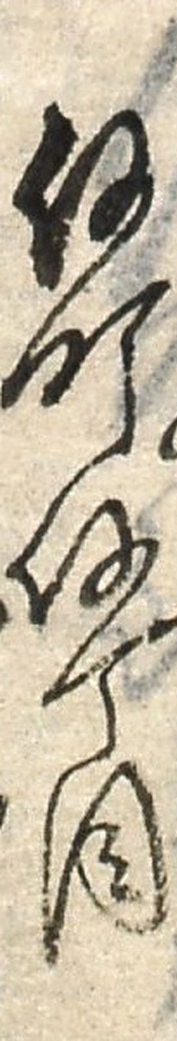何町何丁目
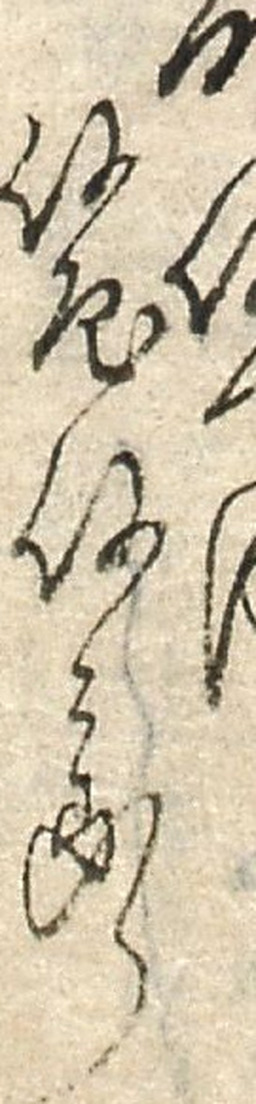何屋何兵衛
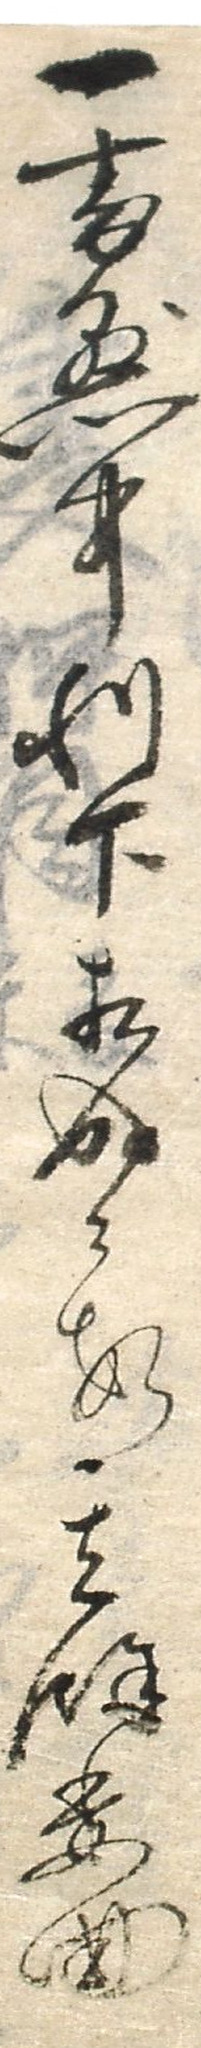一歩懸中利下相成候段其余委曲
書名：御家中并無格御奉公人借銀御仕解一件御書付写其余共控
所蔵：鳴門教育大学 Naruto University of Education
